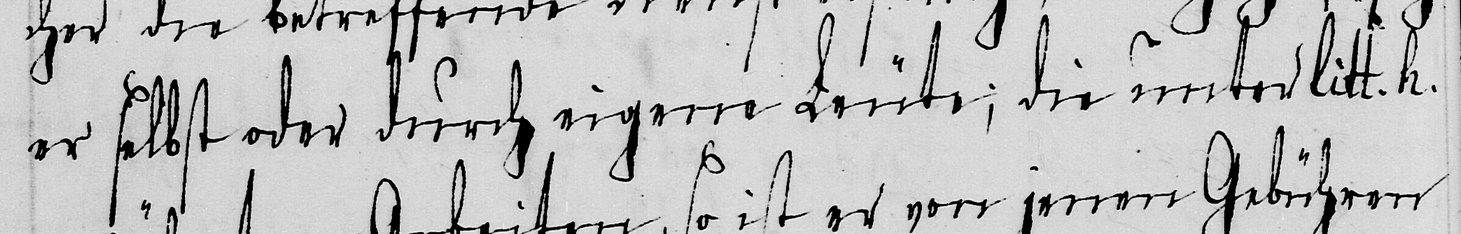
er selbst oder durch eigene Leute; die unter litt.
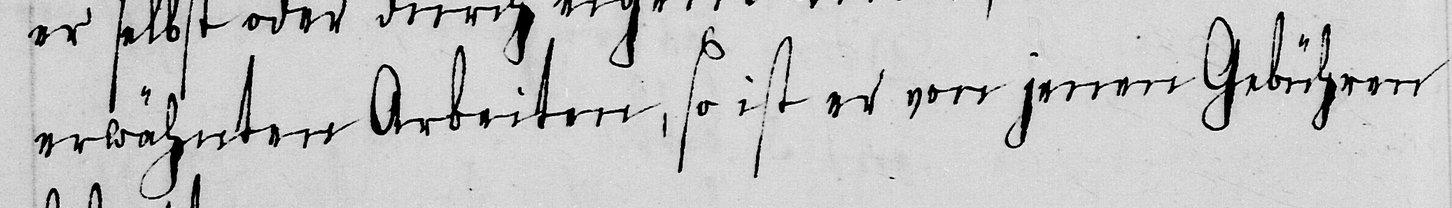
erwähnten Arbeiten, so ist er von jenen Gebühren
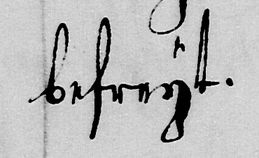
befreyt.
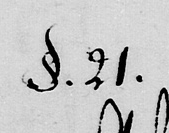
§. 21.
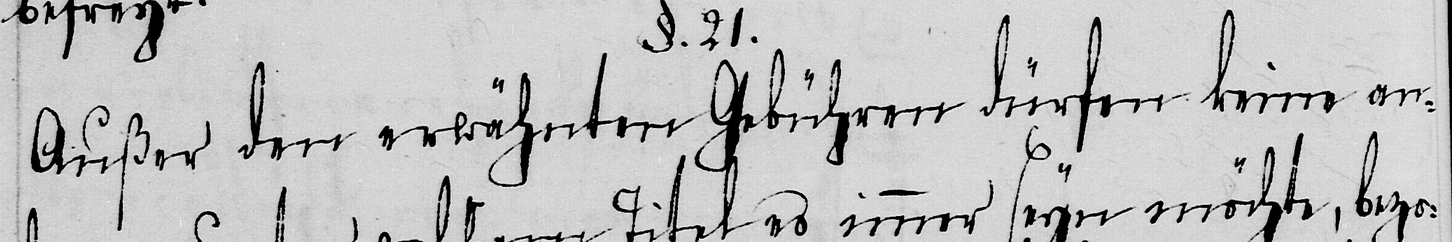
Außer den erwähnten Gebühren dürfen keine an¬
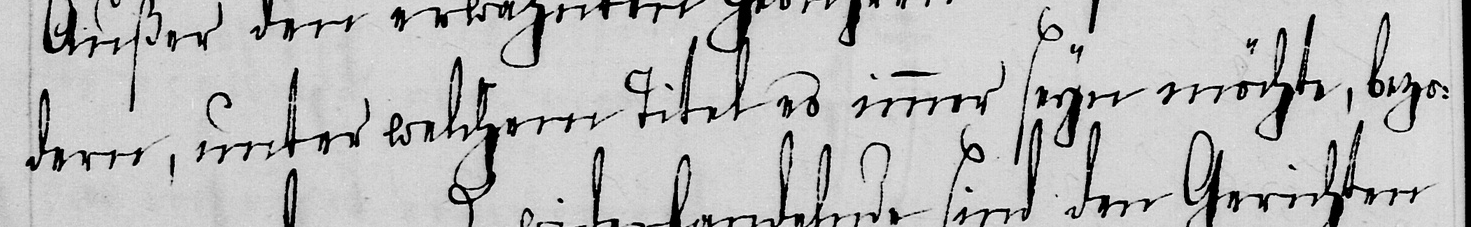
dern, unter welchem Titel es immer seyn möchte, bezo¬
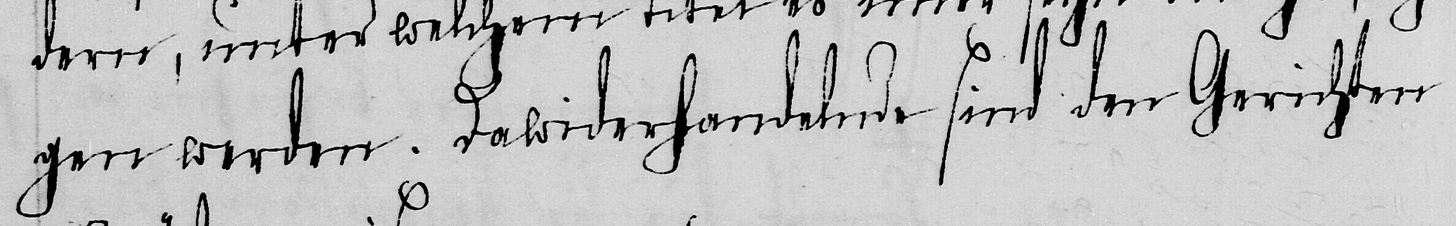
gen werden. Dawiderhandelnde sind den Gerichten
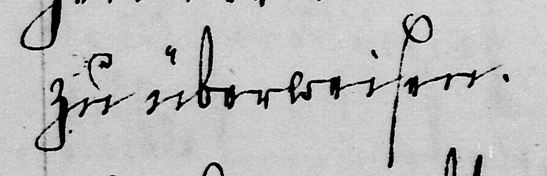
zu überweisen.
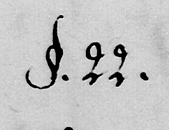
§. 22.
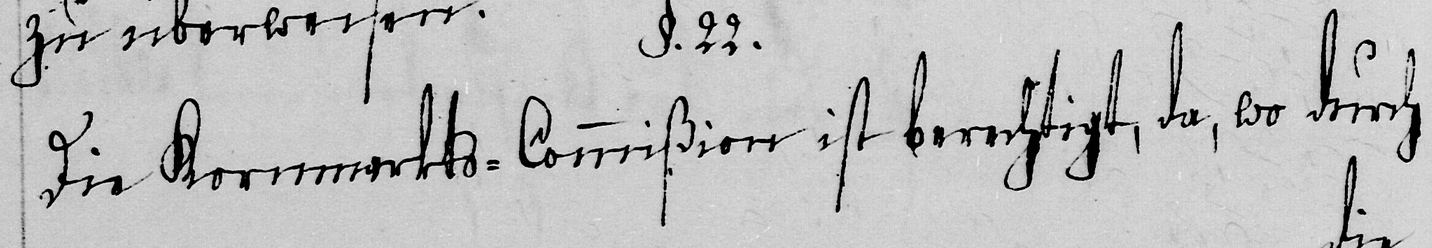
Die Kornmarkts-Commißion ist berechtigt, da, wo dur¬
